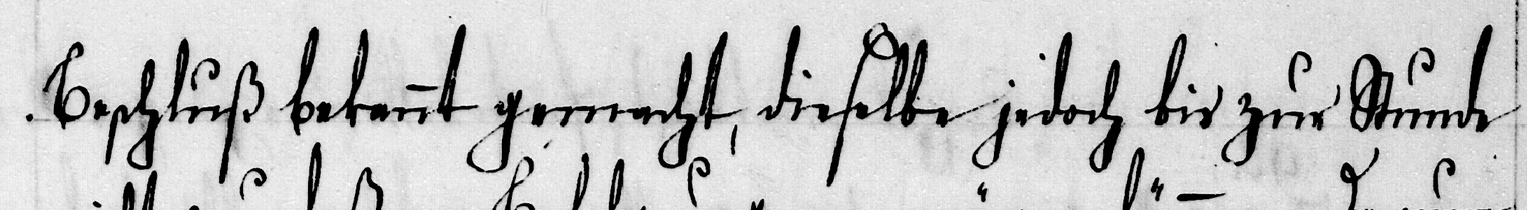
Beschluß bekannt gemacht, dieselbe jedoch bis zur Stunde
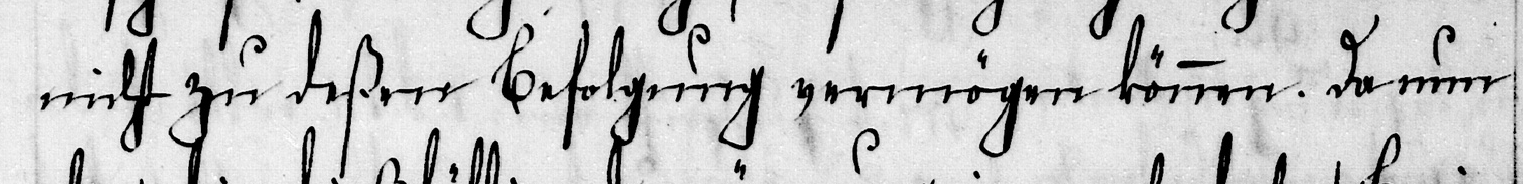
nicht zu deßen Befolgung vermögen können. Da nun
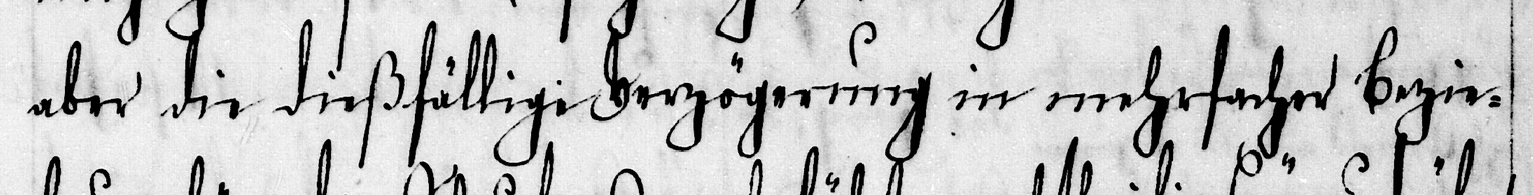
aber die dießfällige Verzögerung in mehrfacher Bezie¬
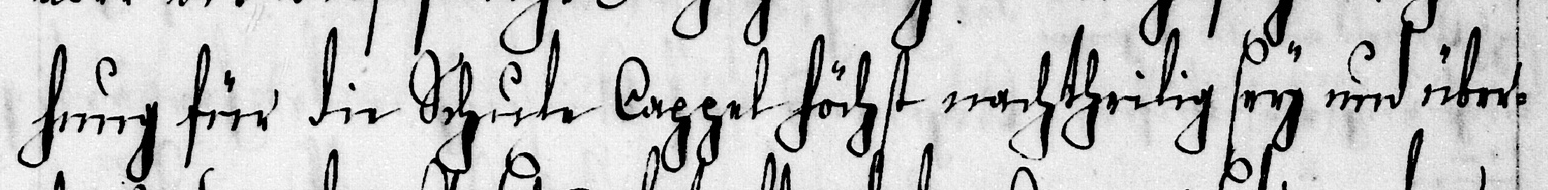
hung für die Schule Cappel höchst nachtheilig sey und über¬
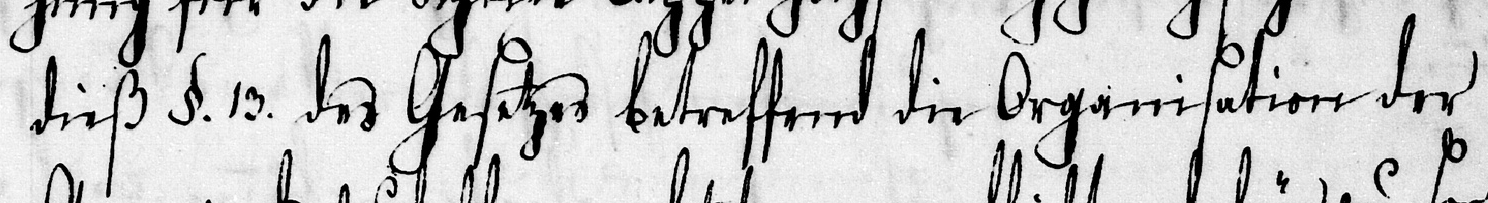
dieß §. 13. des Gesetzes betreffend die Organisation der
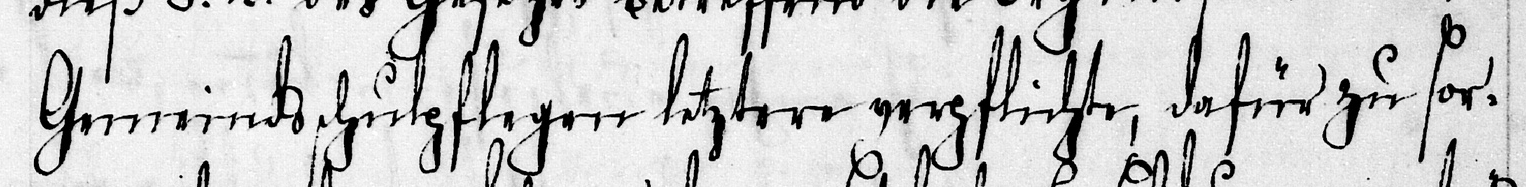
Gemeindsschulpflegen letztere verpflichte, dafür zu sor¬
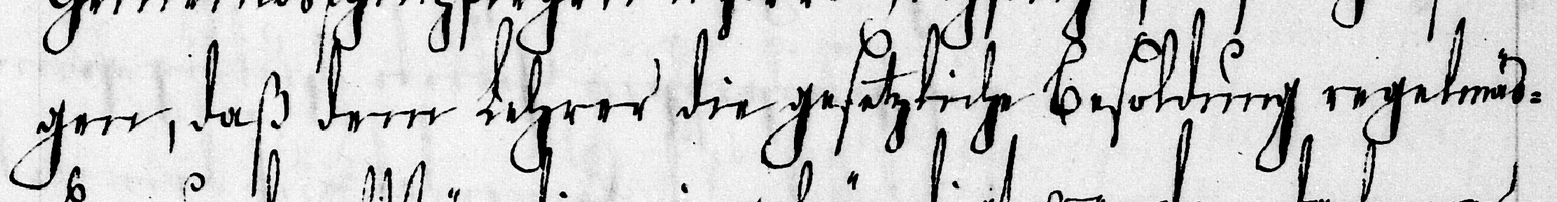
gen, daß dem Lehrer die gesetzliche Besoldung regelmäß¬
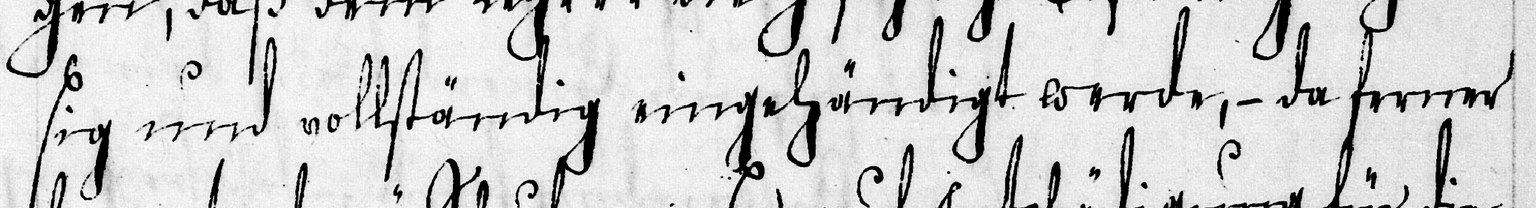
ig und vollständig eingehändigt werde, – da ferner
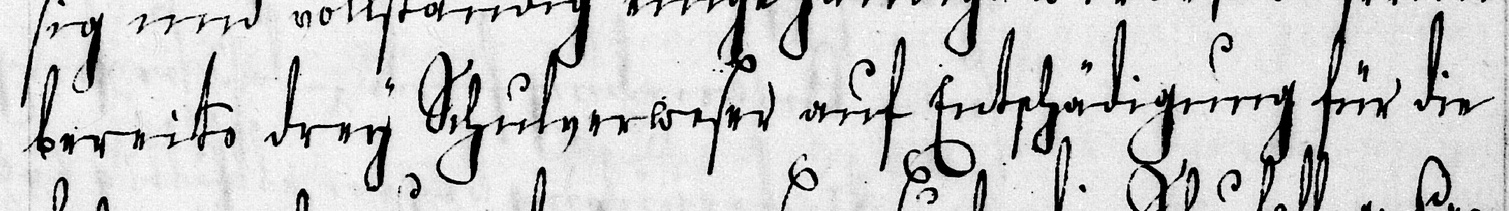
bereits drey Schulverweser auf Entschädigung für die
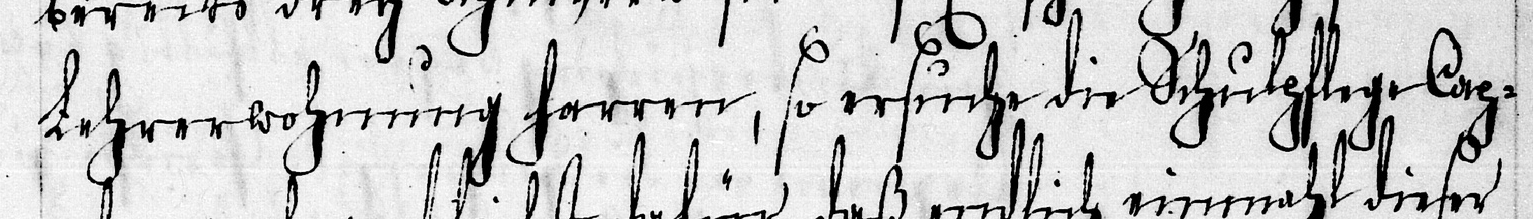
Lehrerwohnung harren, so ersuche die Schulpflege Cap¬
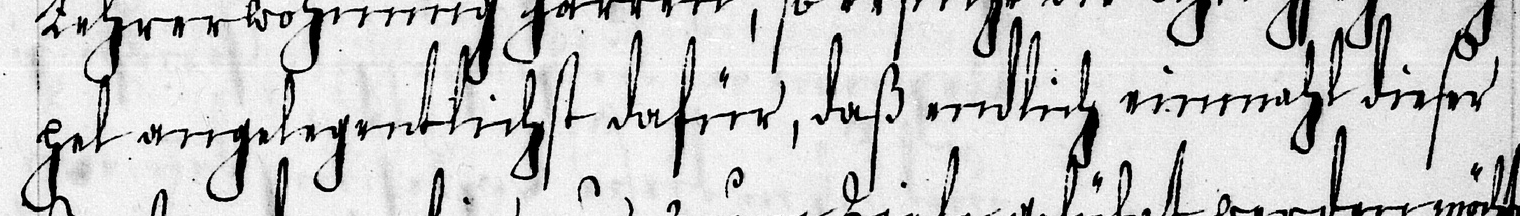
pel angelegentlichst dafür, daß endlich einmahl dieser
